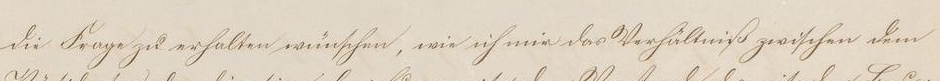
die Frage zu erhalten wünschen, wie ich mir das Verhältniß zwischen dem
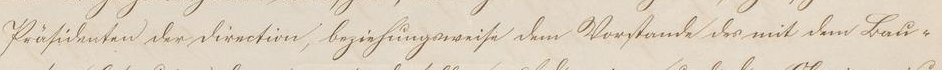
Präsidenten der Direction, beziehungsweise dem Vorstande des mit dem Bau-
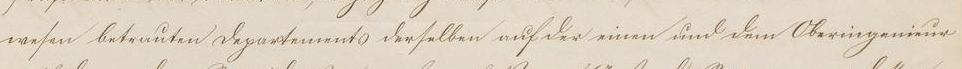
wesen betrauten Departements derselben auf der einen und dem Oberingenieur
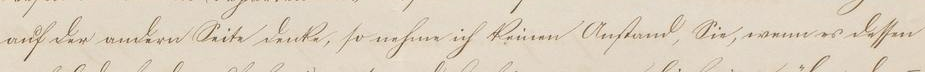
auf der andern Seite denke, so nehme ich keinen Anstand, Sie, wenn es dessen
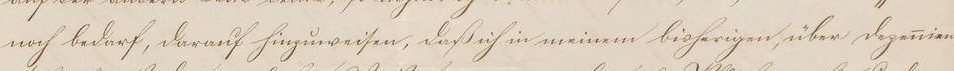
noch bedarf, darauf hinzuweisen, daß ich in meinem bisherigen, über Dezennien
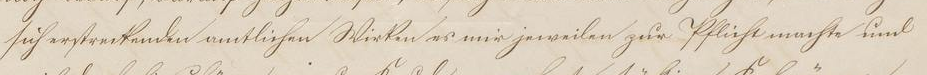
sich erstreckenden amtlichen Wirken es mir jeweilen zur Pflicht machte und
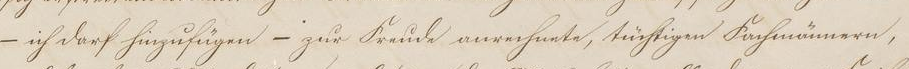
– ich darf hinzufügen – zur Freude anrechnete, tüchtigen Fachmännern,
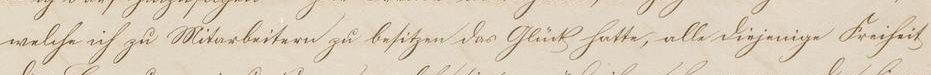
welche ich zu Mitarbeitern zu besitzen das Glück hatte, alle diejenige Freiheit
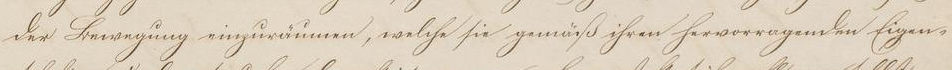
der Bewegung einzuräumen, welche sie gemäß ihren hervorragenden Eigen-
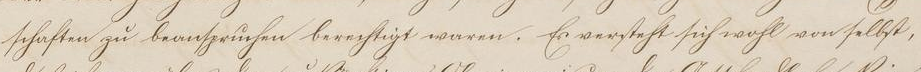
schaften zu beanspruchen berechtigt waren. Es versteht sich wohl von selbst,
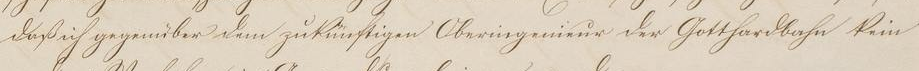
daß ich gegenüber dem zukünftigen Oberingenieur der Gotthardbahn kein
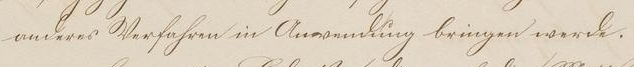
anderes Verfahren in Anwendung bringen werde.
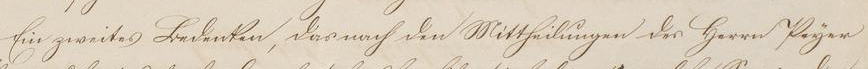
Ein zweites Bedenken, das nach den Mittheilungen des Herrn Peyer
